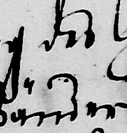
enen
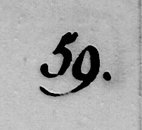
3.
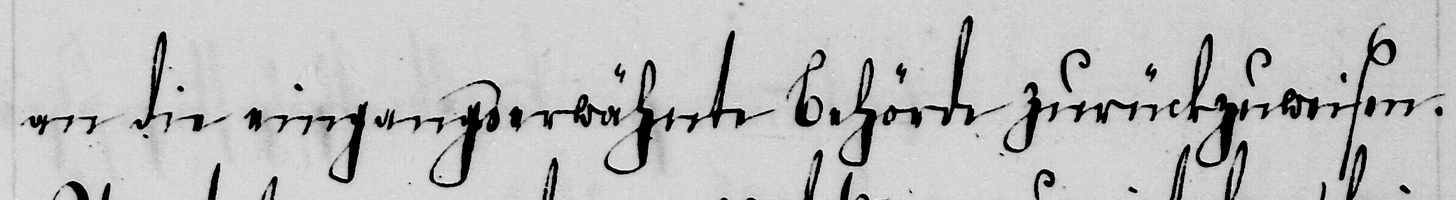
an die eingangs erwähnte Behörde zurückzuweisen.
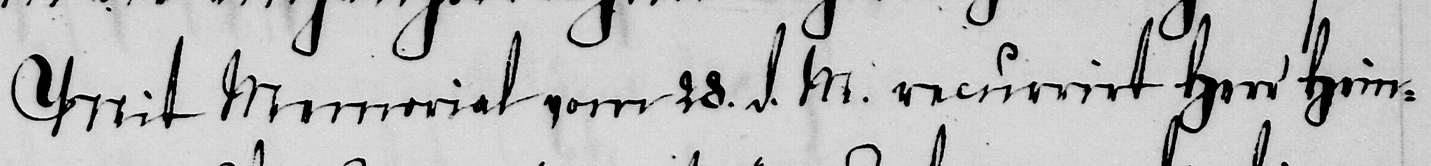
Mit Memorial vom 28. d. M. recurrirt Herr Hein¬
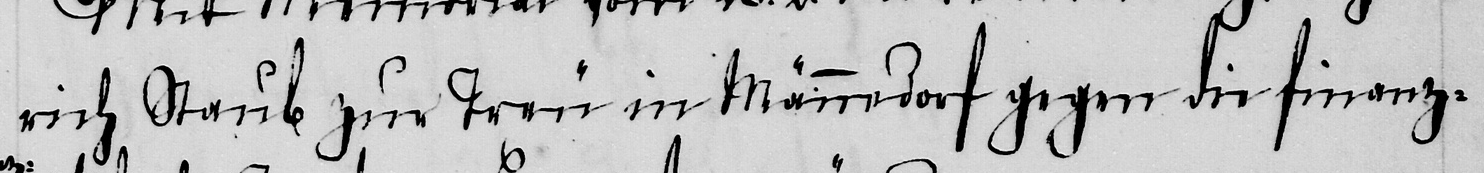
rich Staub zur Treu in Männedorf gegen die finanz¬
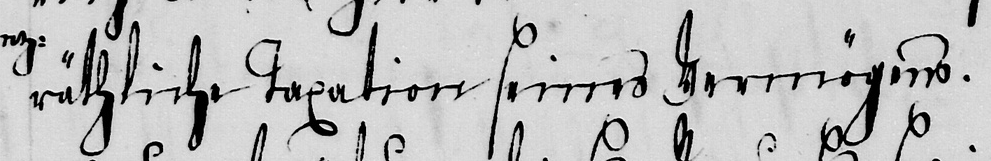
räthliche Taxation seines Vermögens.
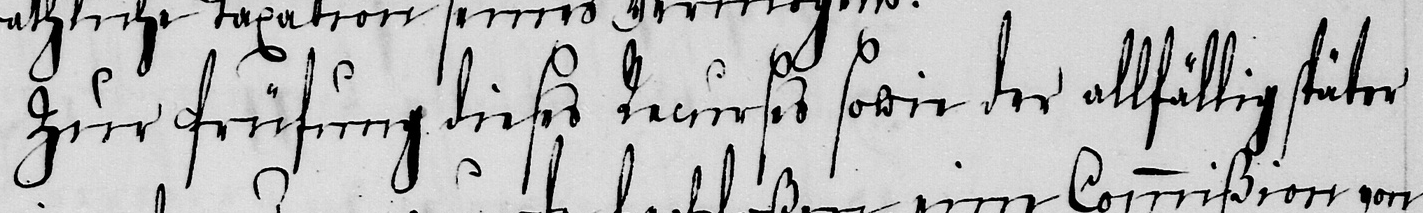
Zur Prüfung dieses Recurses sowie der allfällig
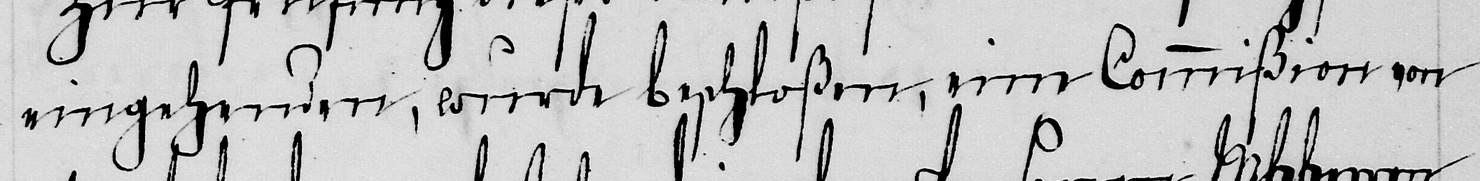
eingehenden, wurde beschloßen, eine Commißion von
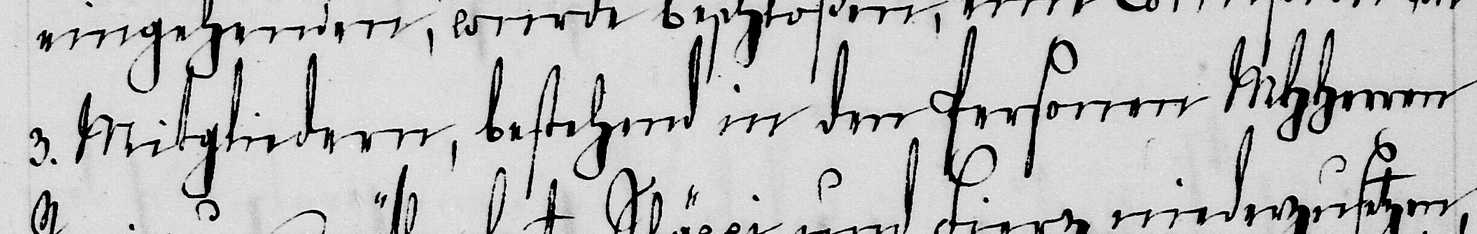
Mitgliedern, bestehend in den Personen MHHerren
